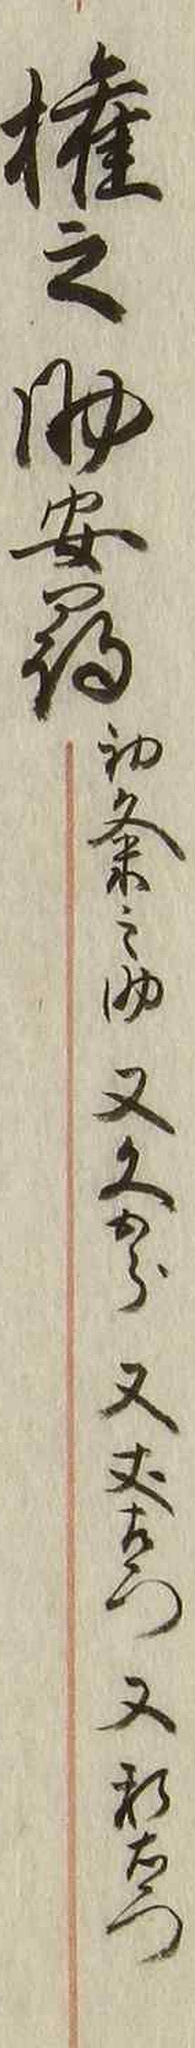権之助安尋初条之助又久五郎又丈左エ門又新右エ門
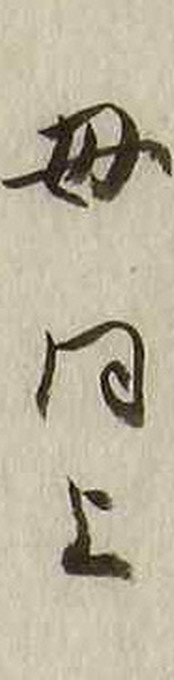母同上
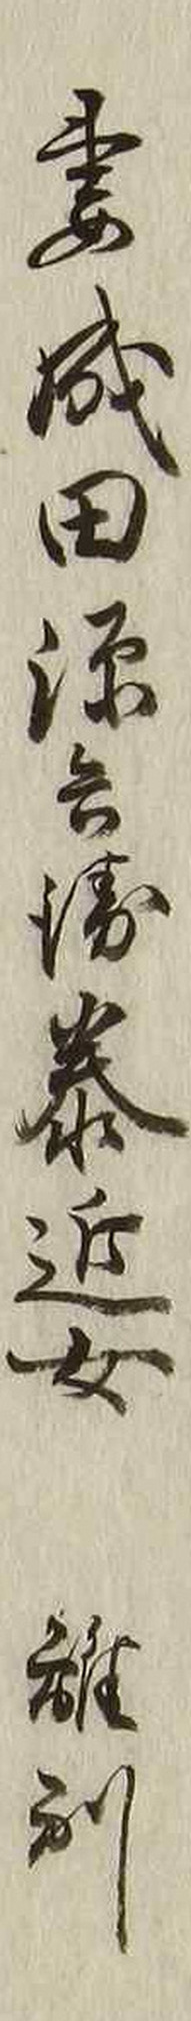妻成田源兵衛泰近女離別
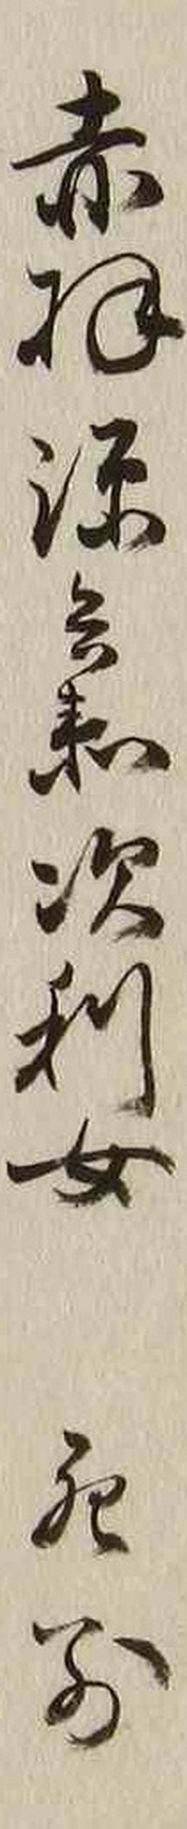赤羽源兵衛次利女死別
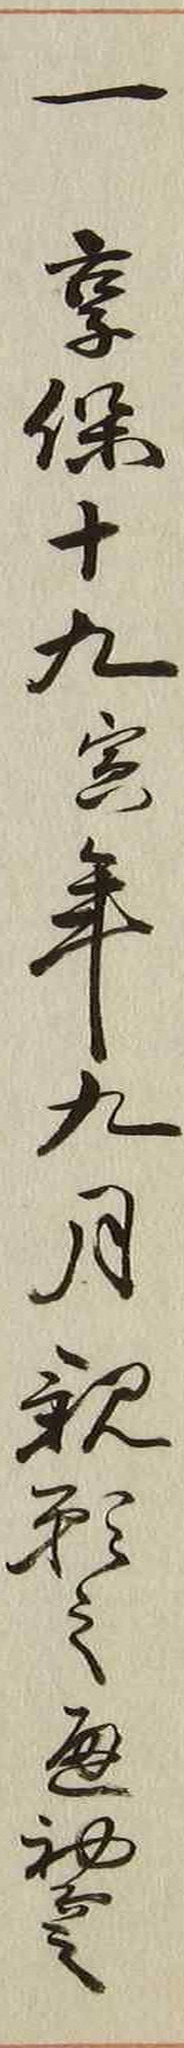一享保十九寅年九月親願之通初而之
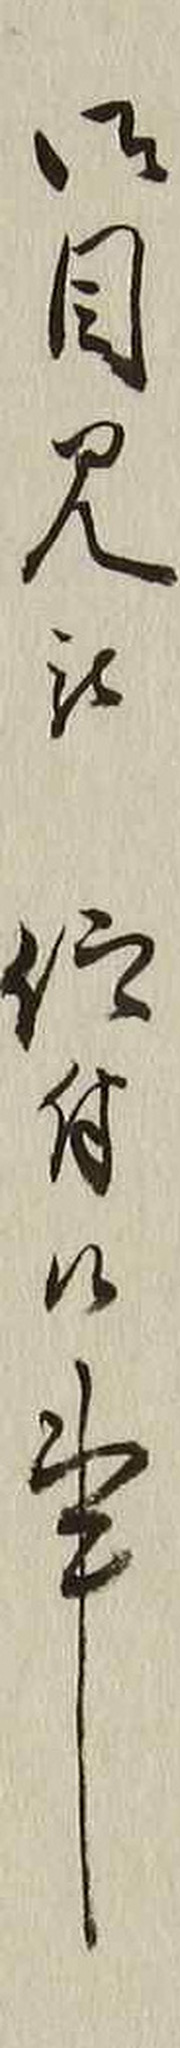御目見被仰付候事
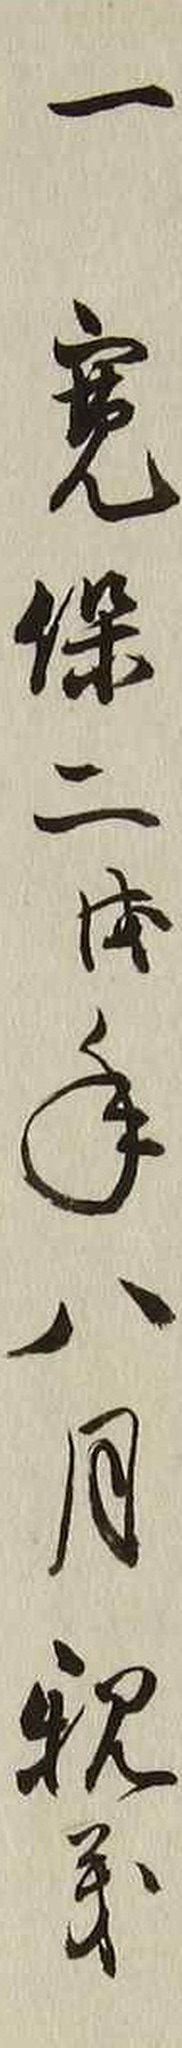一寛保二戌年八月親義
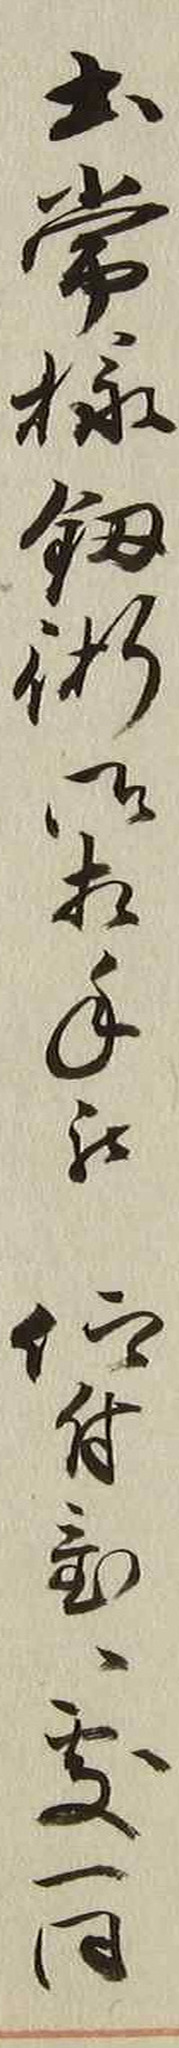土常様剣術御相手被仰付置候処一同
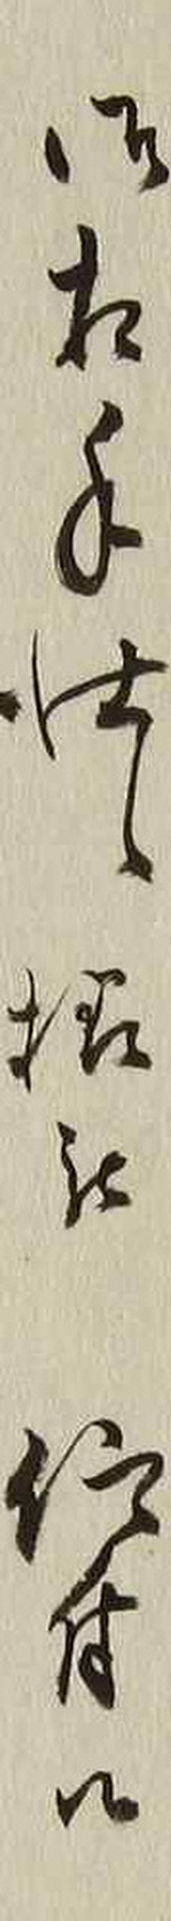御相手仕候様被仰付候
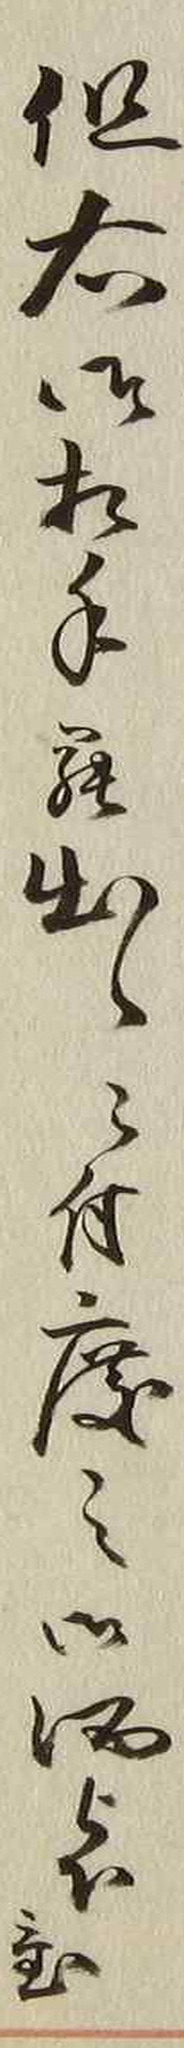但右御相手罷出候ニ付度々御酒被下置
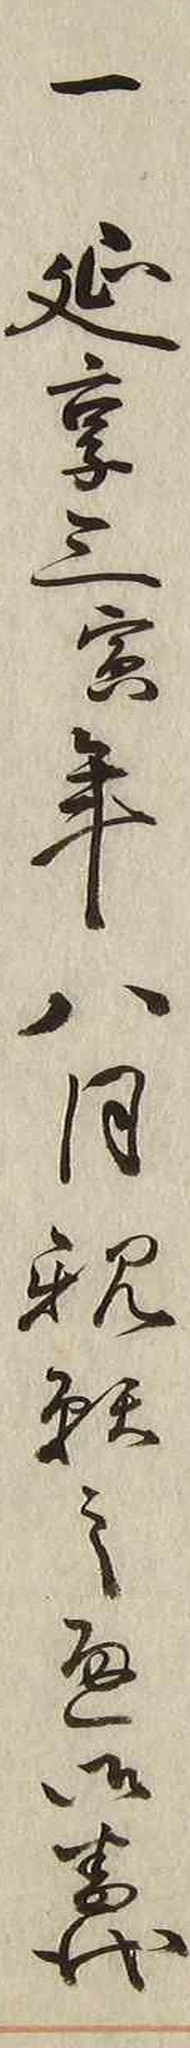一延享三寅年八月親願之通御番代
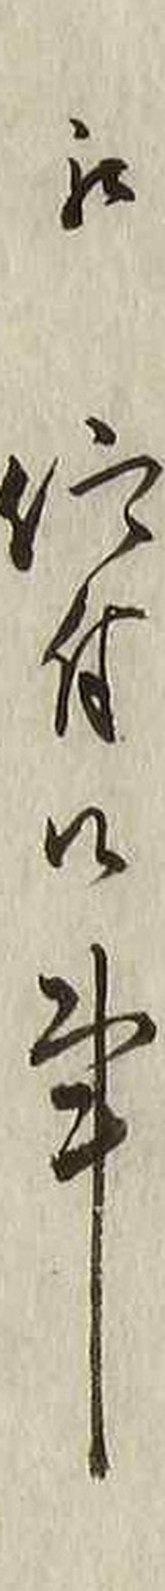被仰付候事
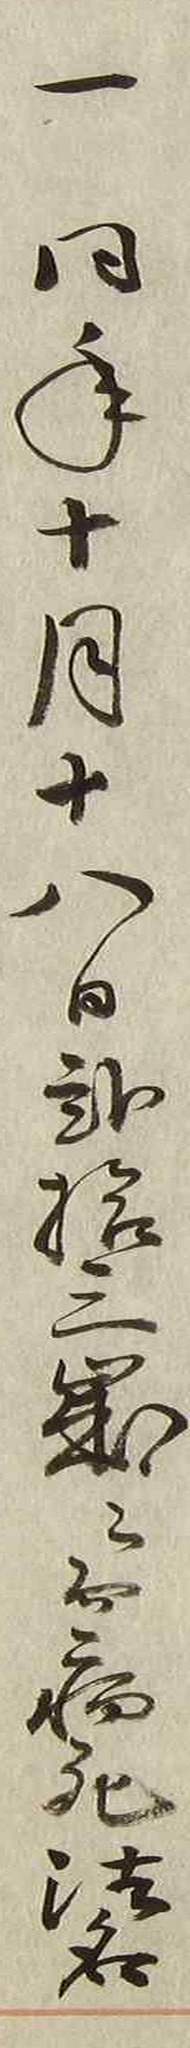一同年十月十八日弐拾三歳ニ而病死法名
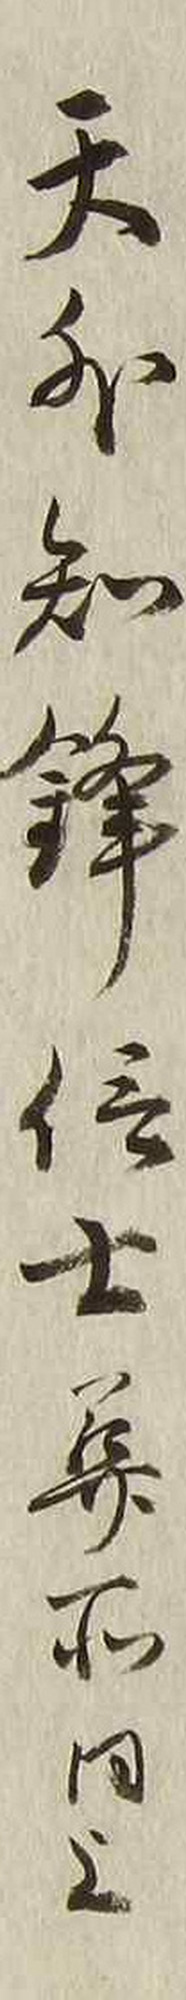天外知鋒信士葬所同上

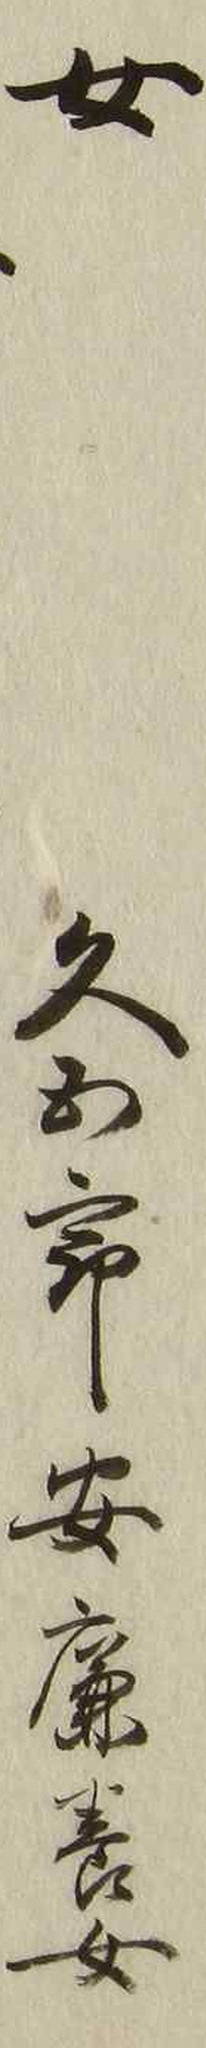女久五郎安廉養女
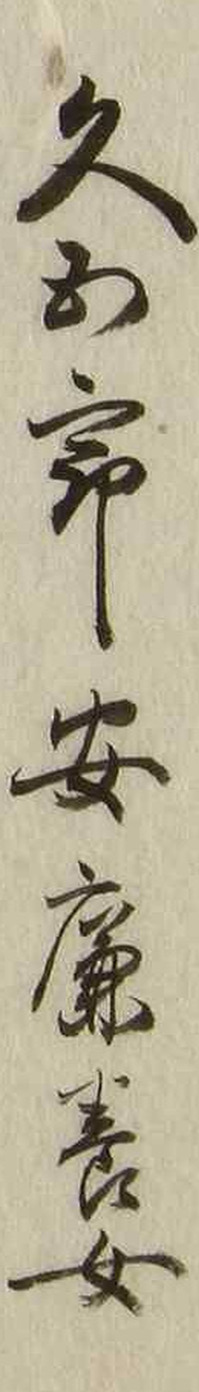女久五郎安廉養女
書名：諸士系譜　巻之15　い之部15
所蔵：会津若松市立会津図書館
